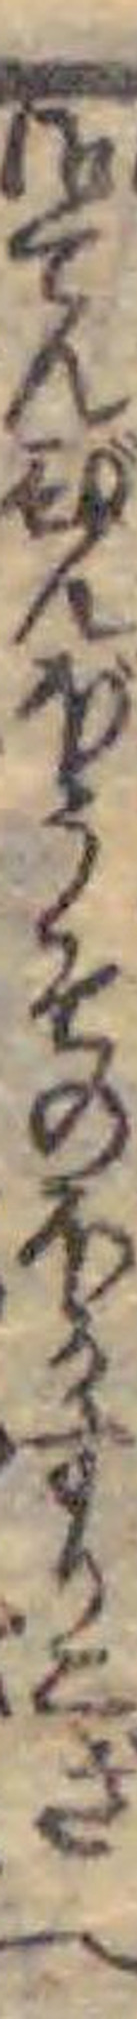御てんびんぼうそのほかすりこぎ
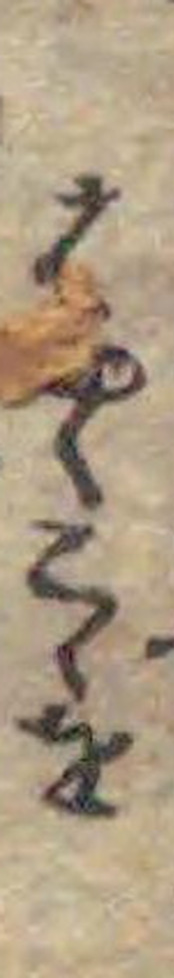はやくこゝを
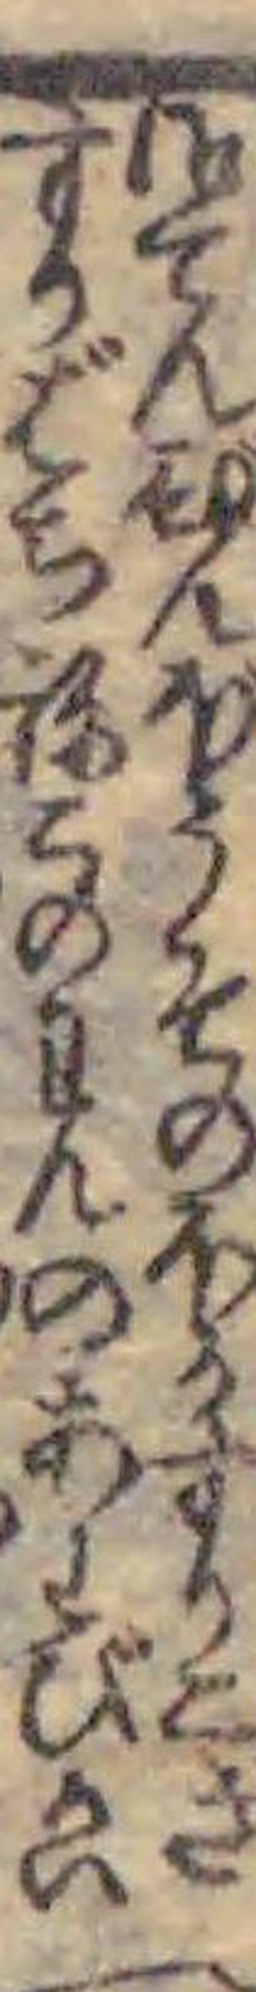すりばちねこのわんのあわびかい
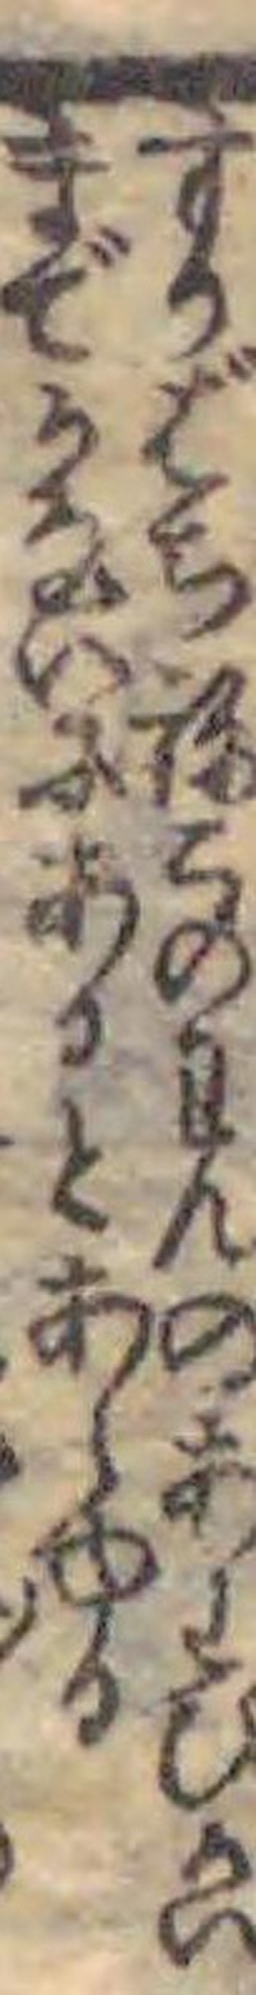までかないにあるとあらゆる
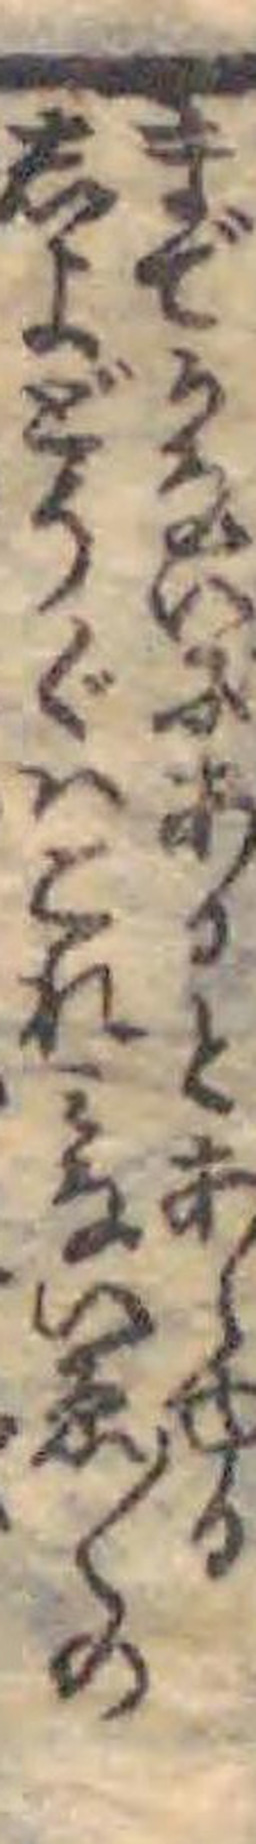しよどうぐはこれみないゑ〳〵の
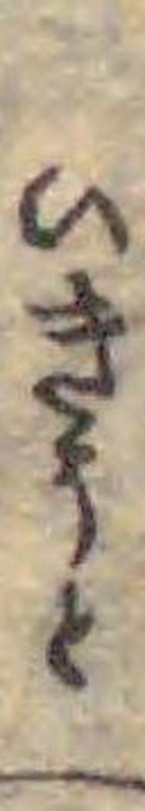いきうと
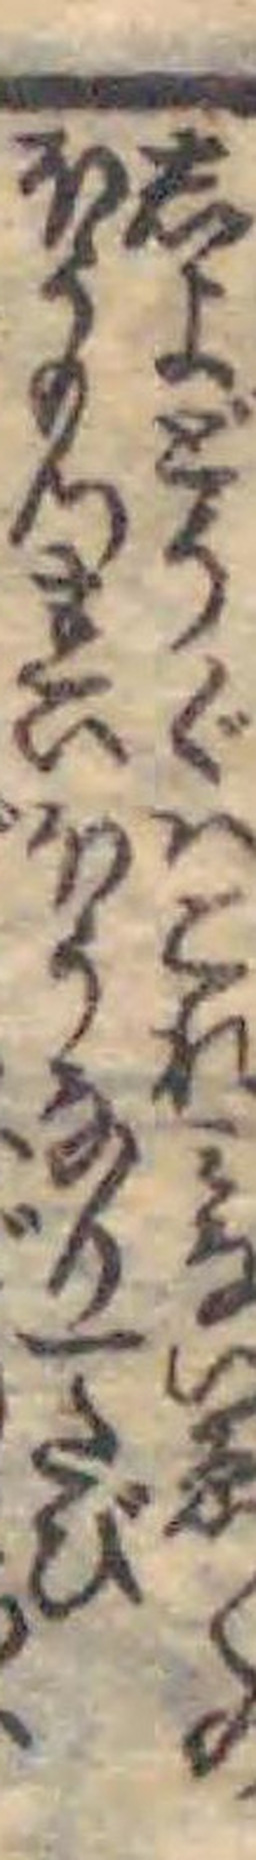ほうもつれいほうなり一たび
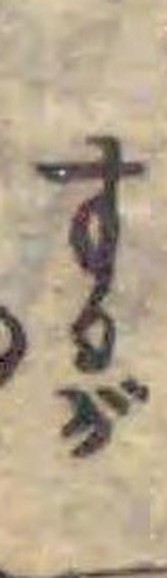するが
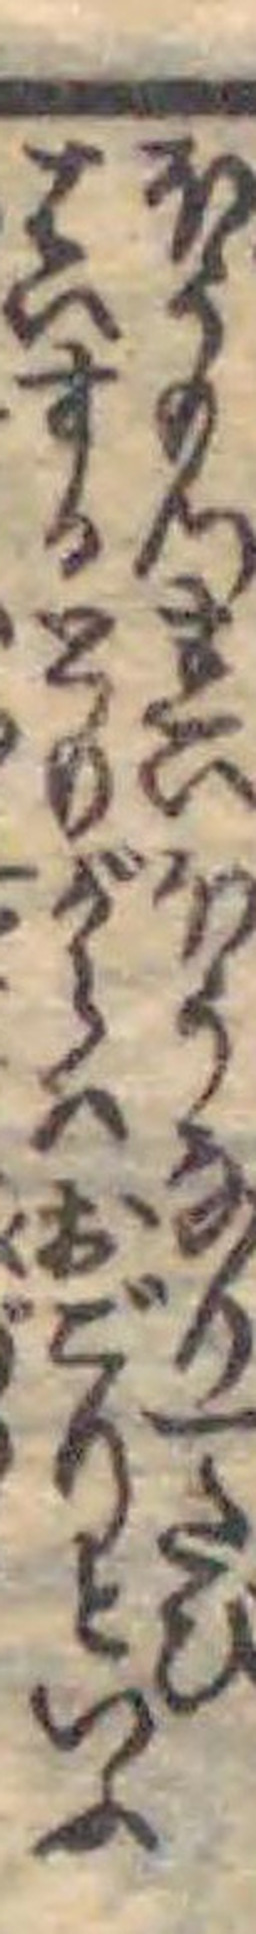はいするともがらはおごりといふ
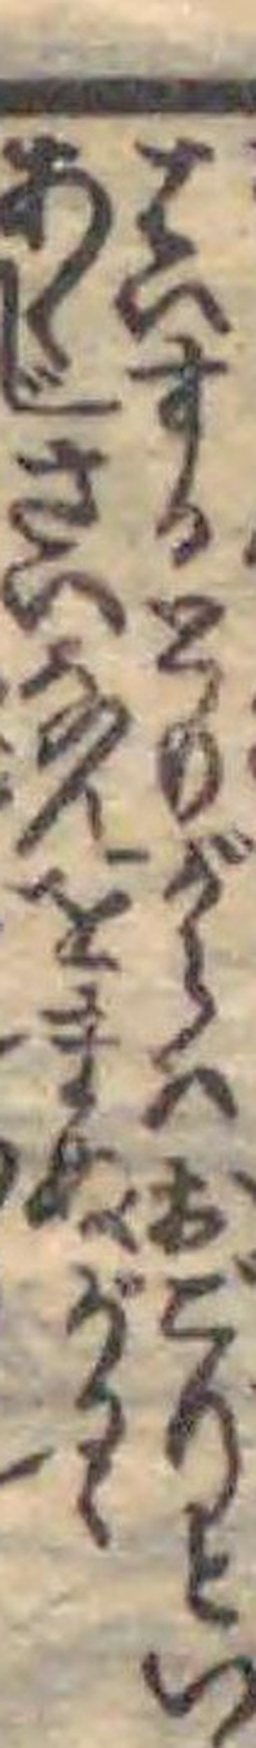あくじさいなんをまぬがるゝ
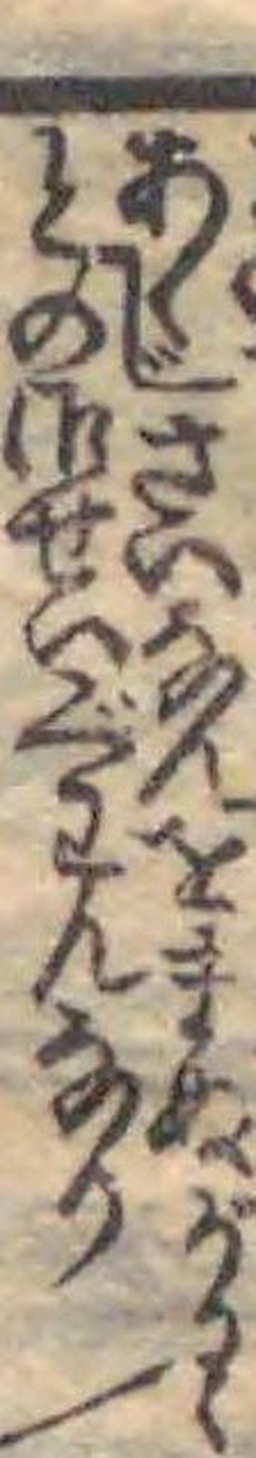との御せいぐわんなり
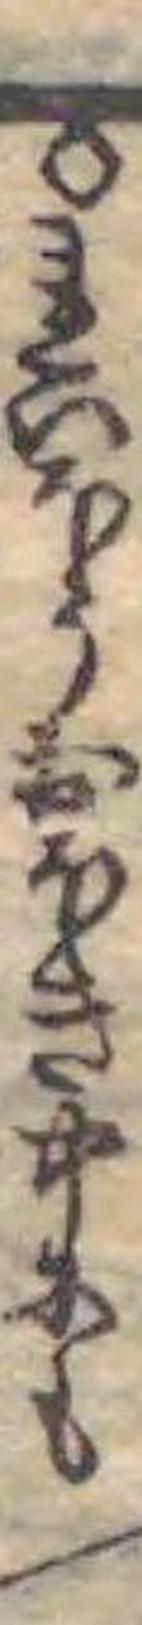丸れいほうおほき中にも
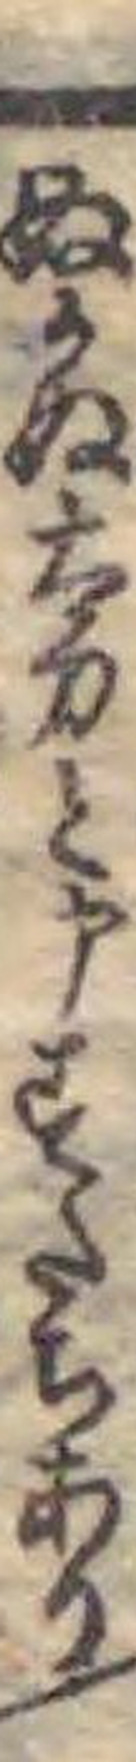ぬかぬ太刀と申すたちあり
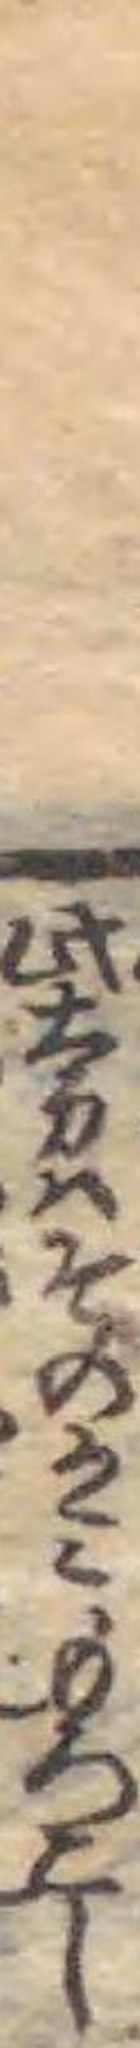此太刀はそのかみもろこし
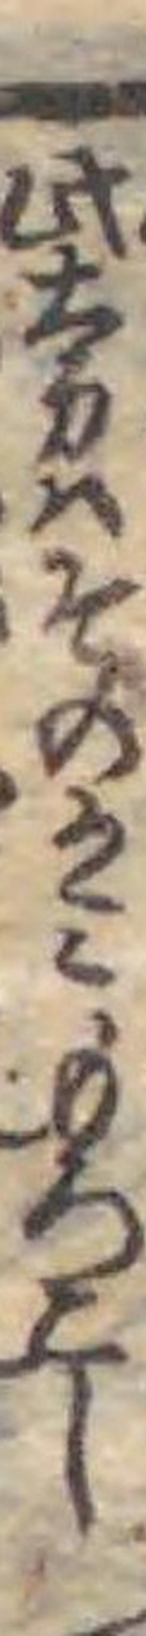此太刀はそのかみもろこし
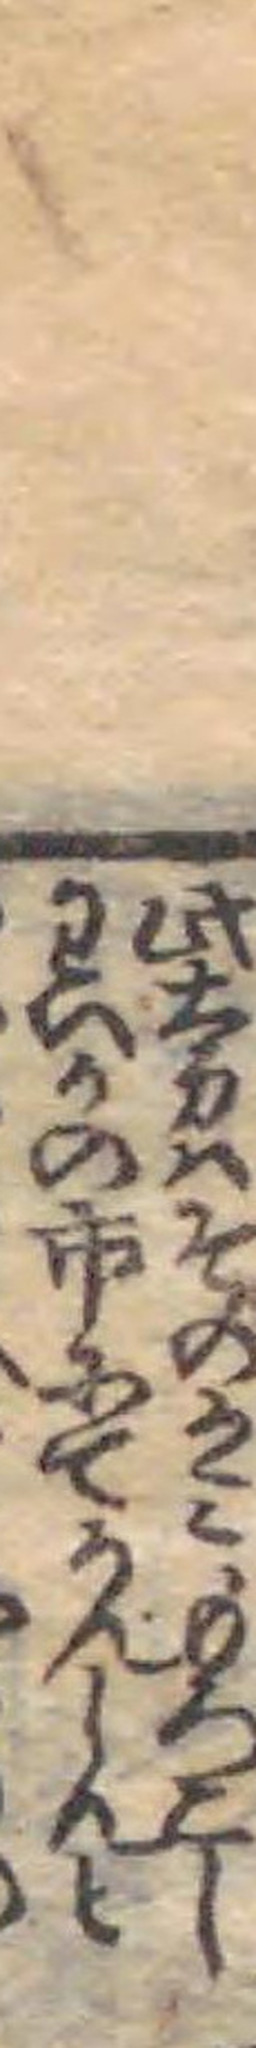わいかの市にてかんしんと
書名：身体開帳略縁起 : 3巻
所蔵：国立国会図書館 National Diet Library, JAPAN
